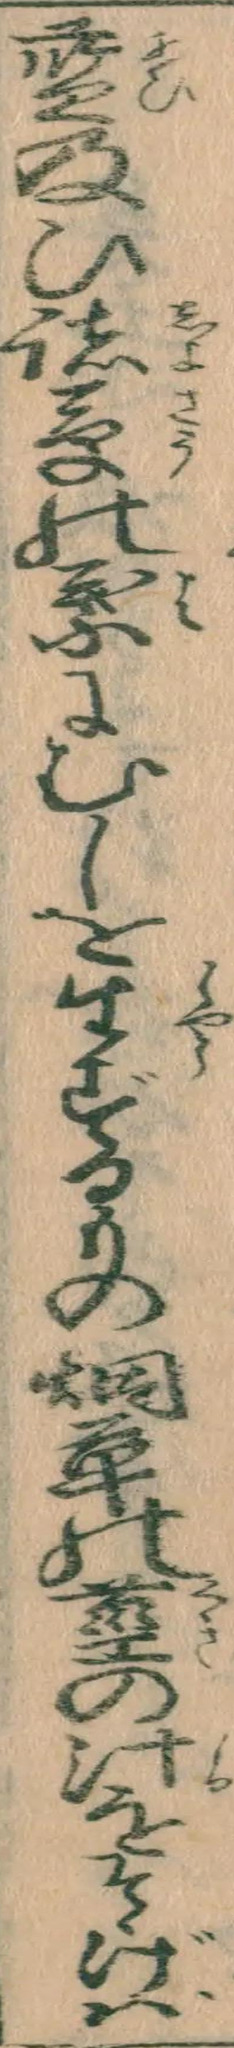藍及ひ諸草の葉にむしを生ずるもの烟草の茎の汁をそゝげば
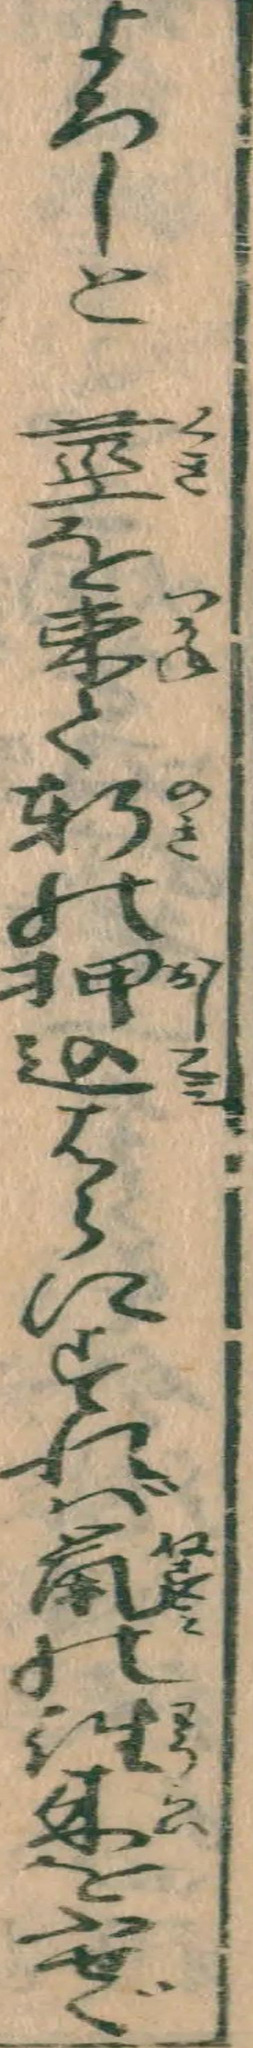よろしと茎を束て軒の押込はらにすれば鼠の往来をふせぐ
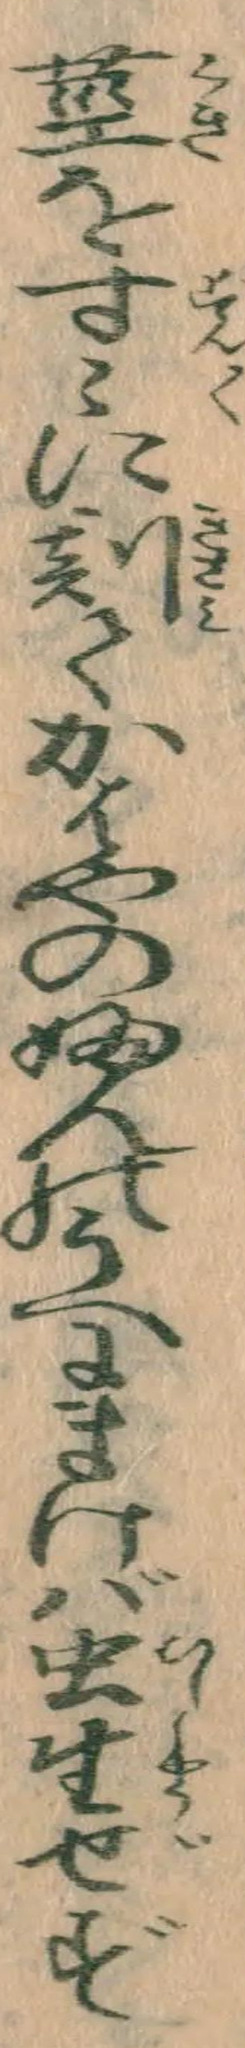茎を寸々に刻てかはやのふんのうへにまけば虫生ぜず
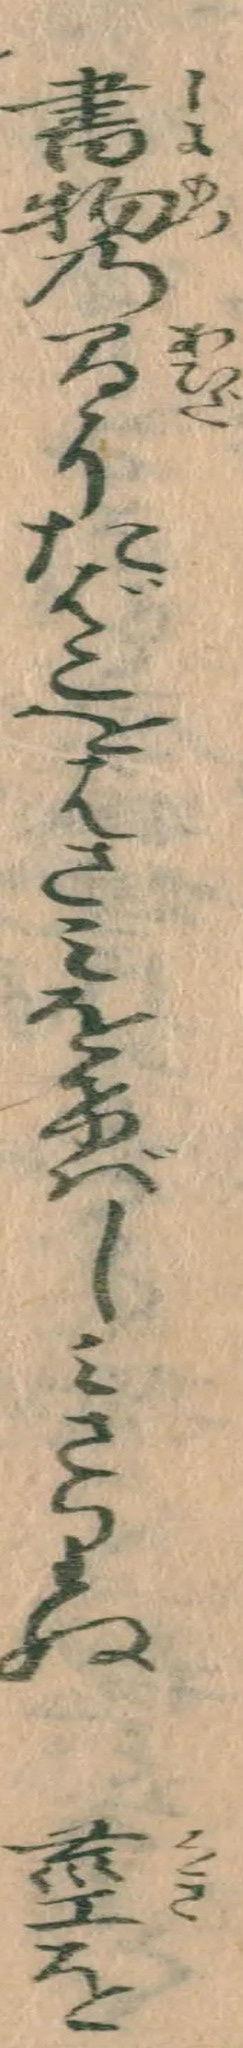書物の間にたばこをはさみをけばしみさりぬ茎を
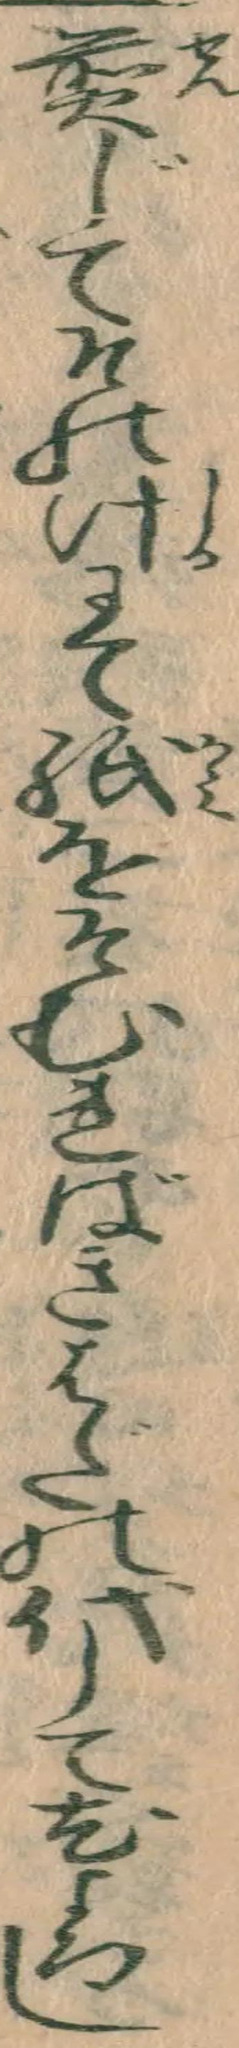煎じてその汁にて紙をそむればきはだの代して尤よろし
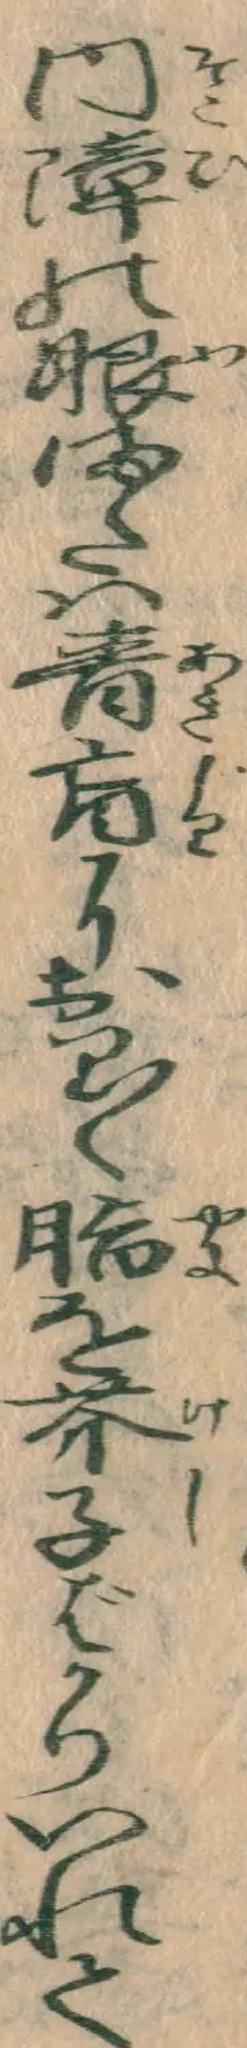内障の眼または青盲におり〳〵脂を芥子ばかりいれて
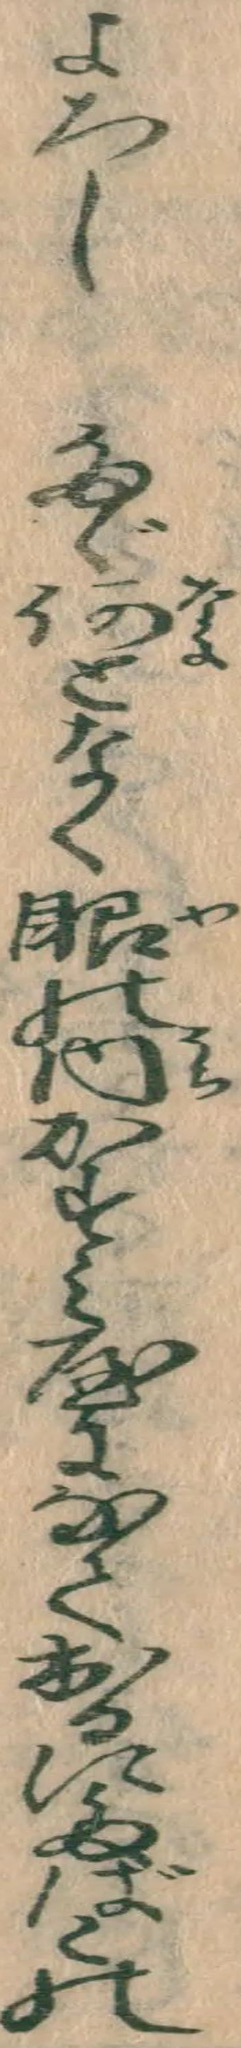よろしたゞ何となく眼の内かすみやになて出るにたばこの
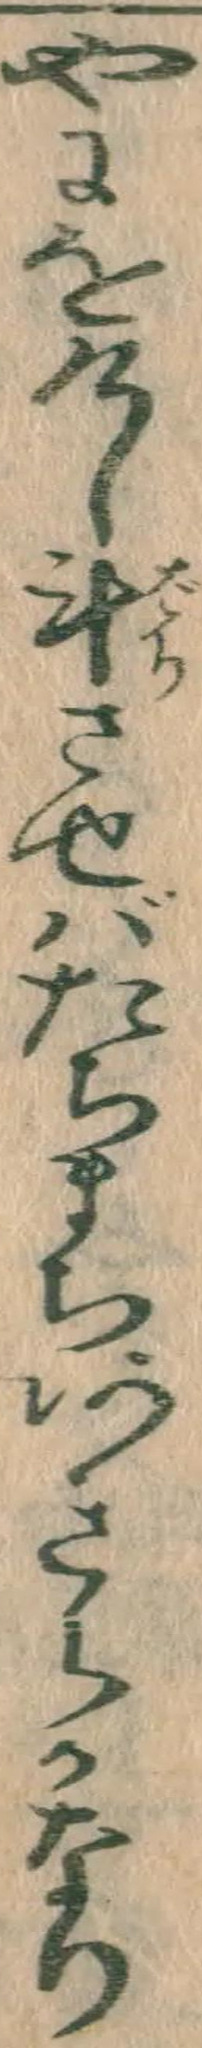やにをけし計させばたちまちあきらかなり
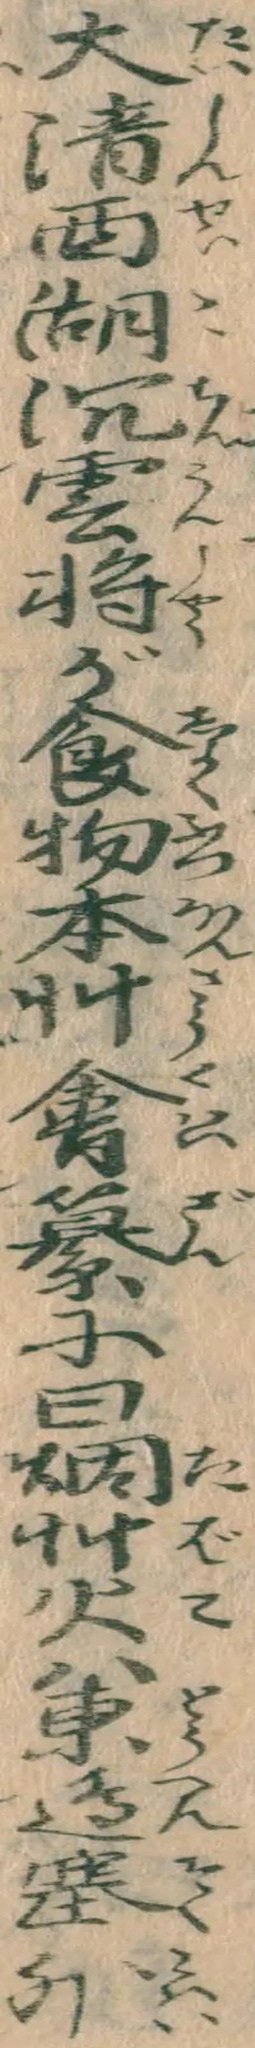大清西湖沈雲将が食物本草会纂に曰烟草火は東辺塞外
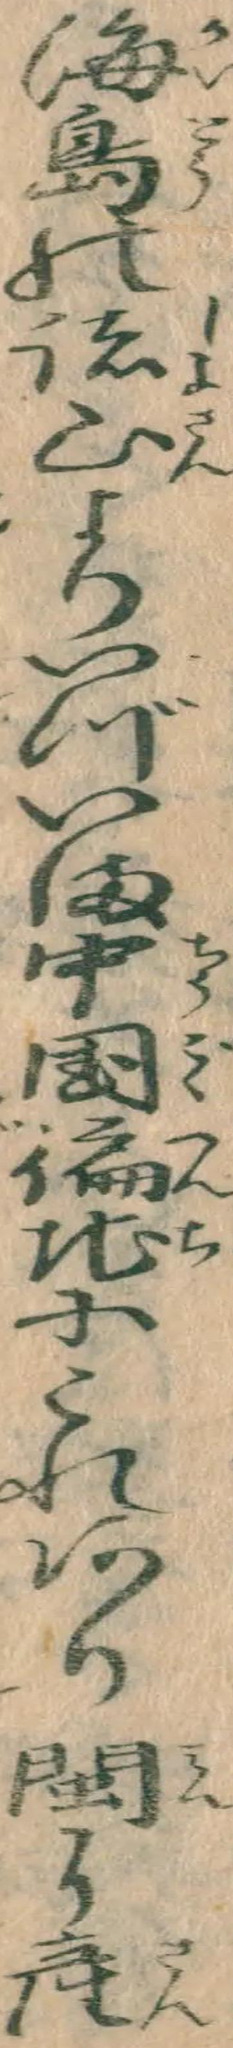海島の諸山よりいづいま中国偏地にこれあり閩に産
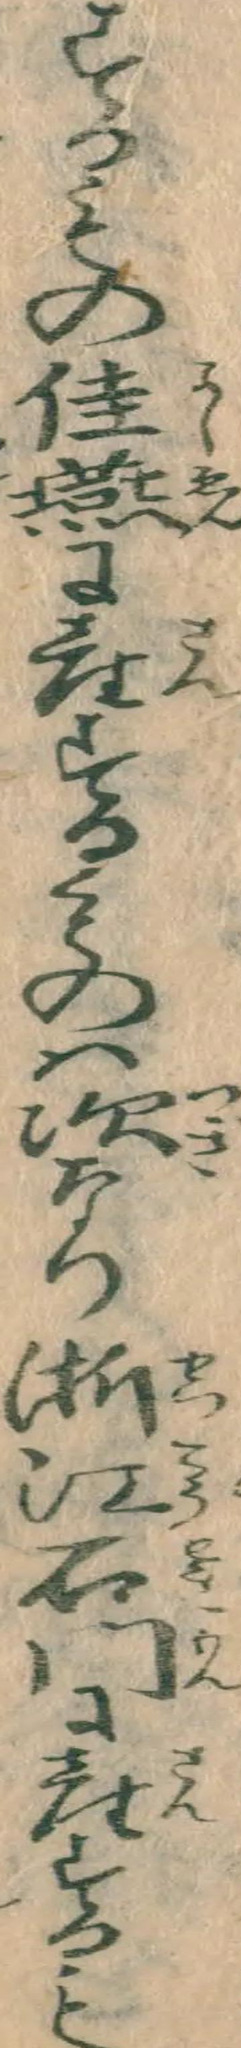するもの佳燕に産するものは次なり浙江石門に産するも
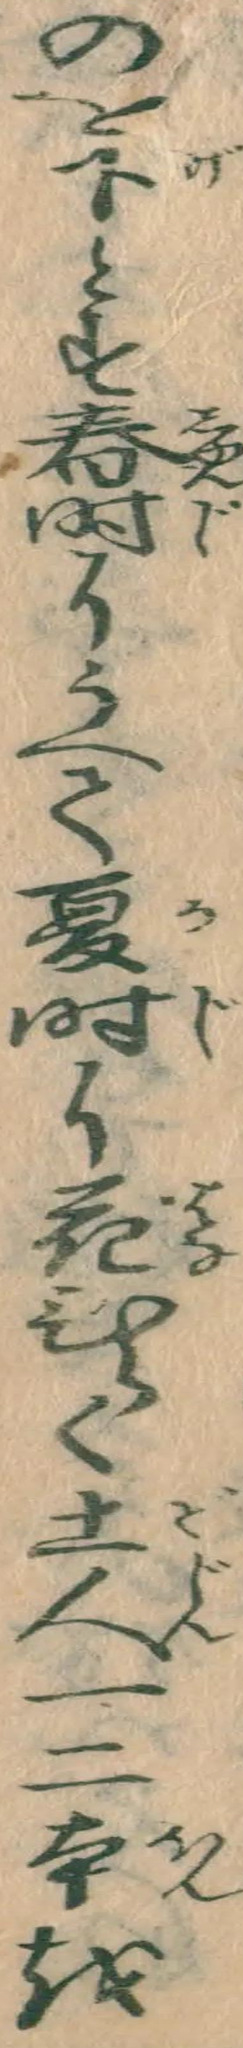のを下とす春時にうへて夏時に花ひらく土人一二本を

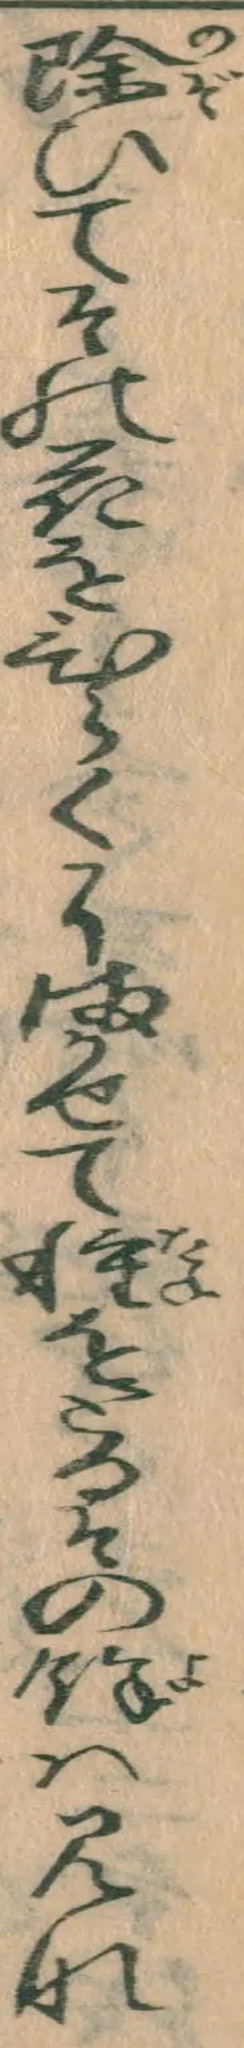除ひてその花をひらくにまかせて種をとるその余はみな
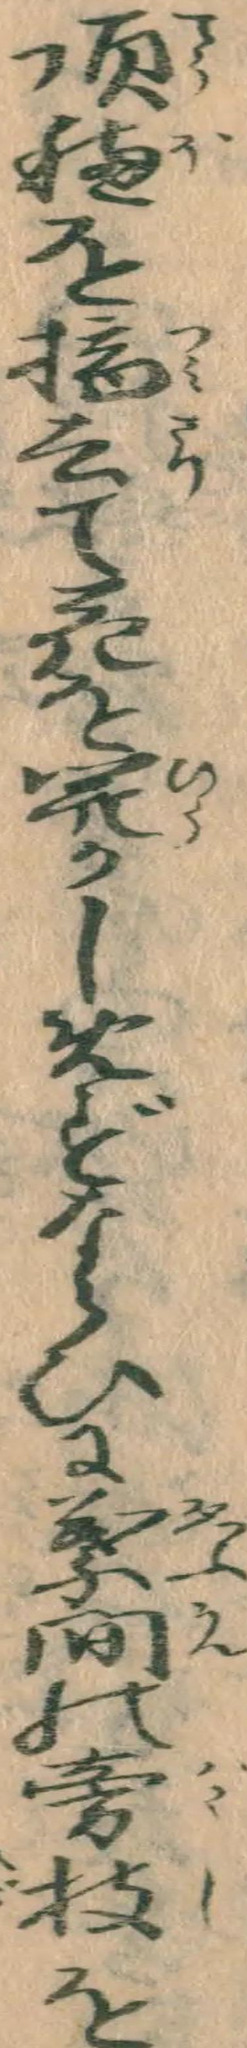頂穂を摘去て花を開かしめずならひに葉間の旁枝を
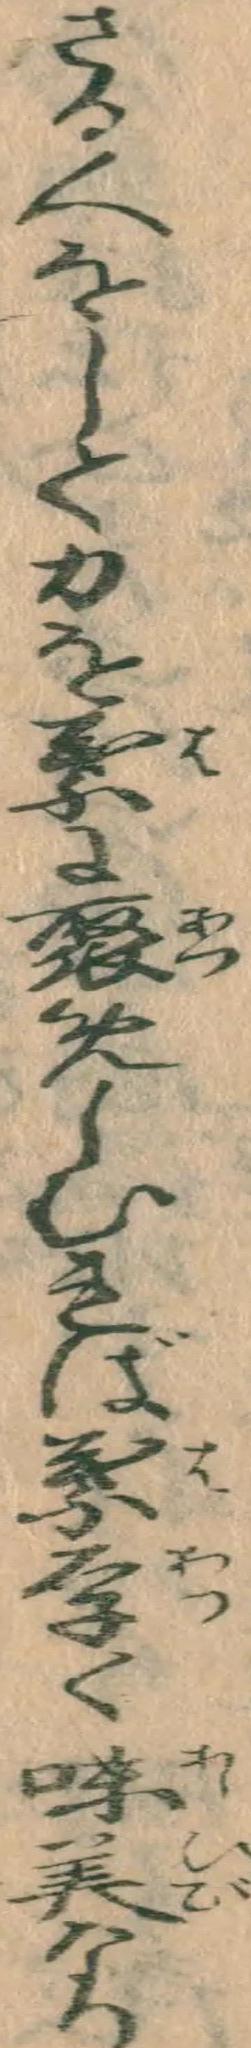さる人をして力を葉に聚めしむれば葉厚く味美なり
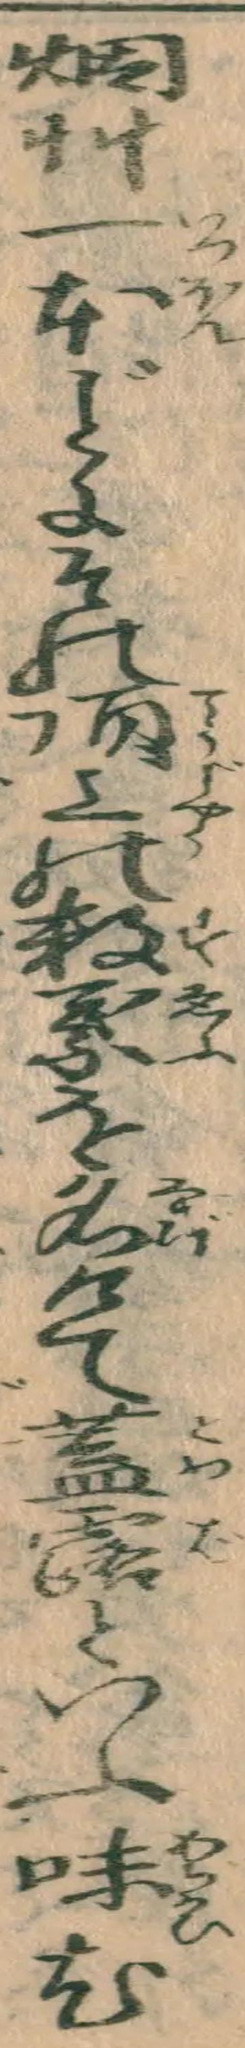烟草一本ごとにその頂上の数葉を名けて蓋露といふ味尤
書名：煙草記
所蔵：国立国会図書館 National Diet Library, JAPAN
